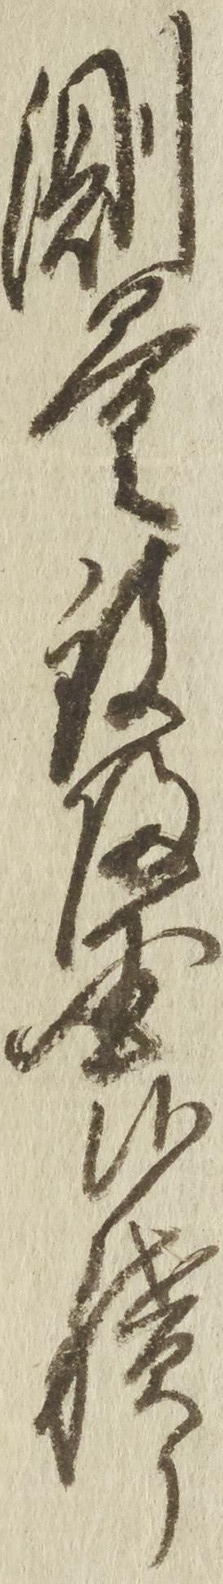測量致帰国候積り
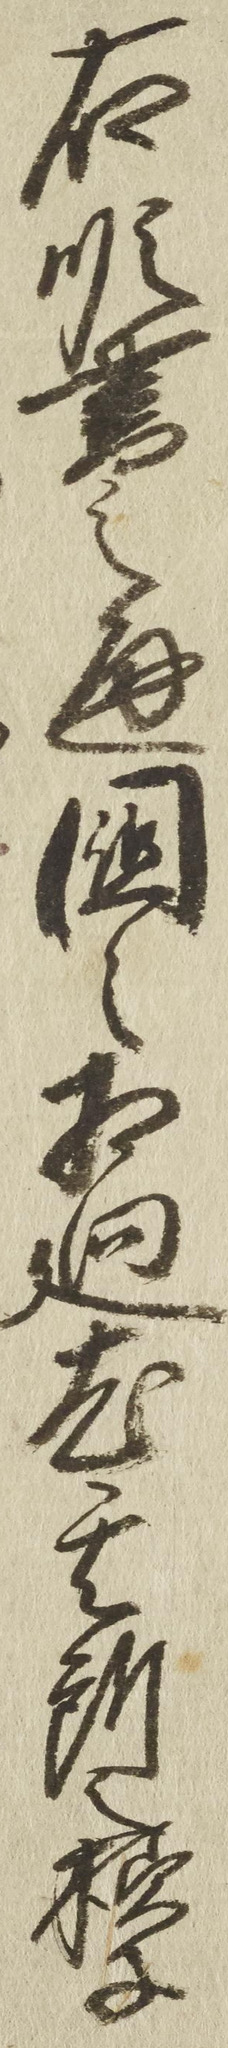右順番之通国々相廻尤其所之様子
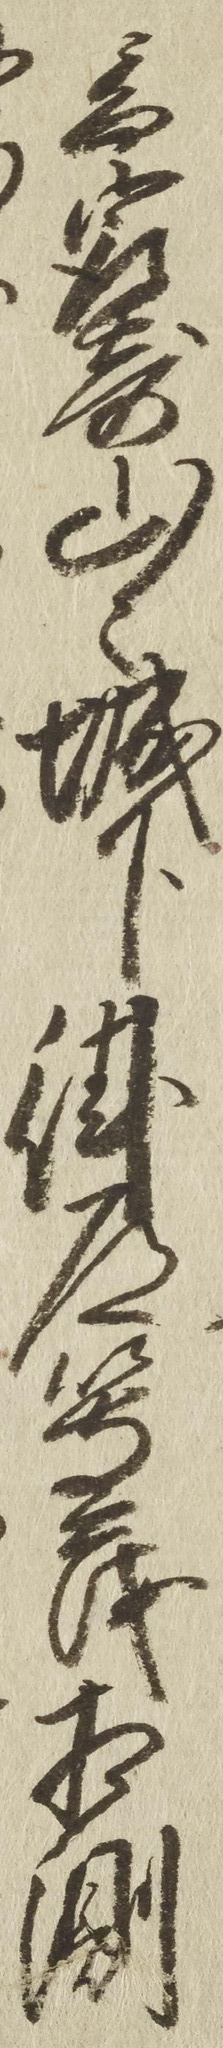ニ而最寄山々城下街道等も相測
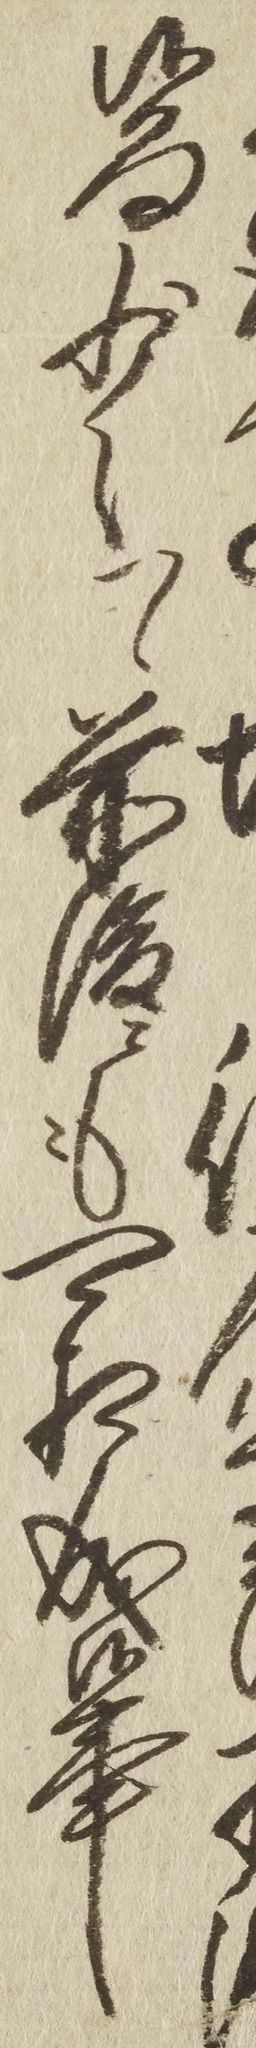候間少々ツヽ前後ニも可相成候事
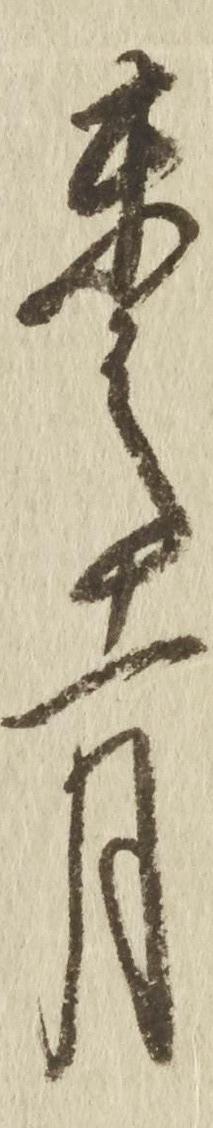未之十一月
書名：天文方御廻御先触写
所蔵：東京大学地震研究所図書室 Earthquake Research Institute Library, The University of Tokyo, JAPAN
